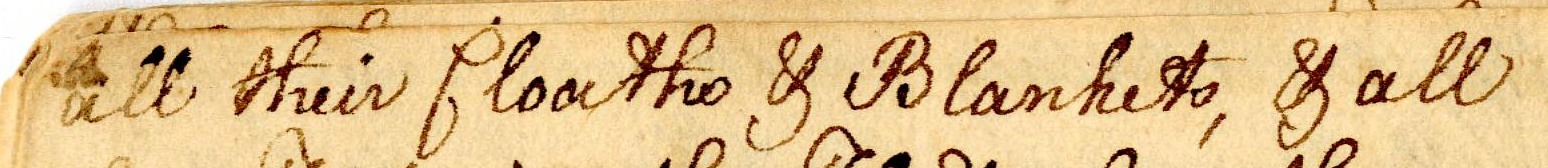all their Cloaths & Blankets, & all
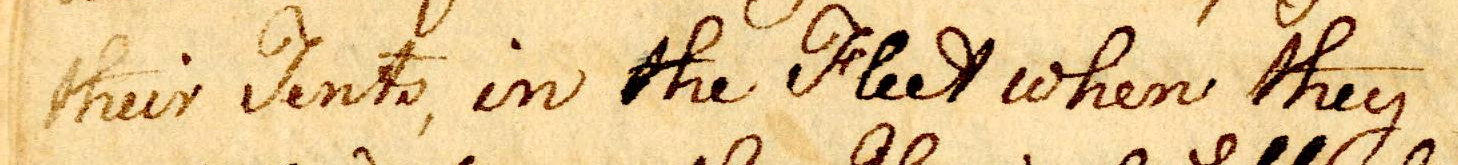their Tents in the Fleet when they
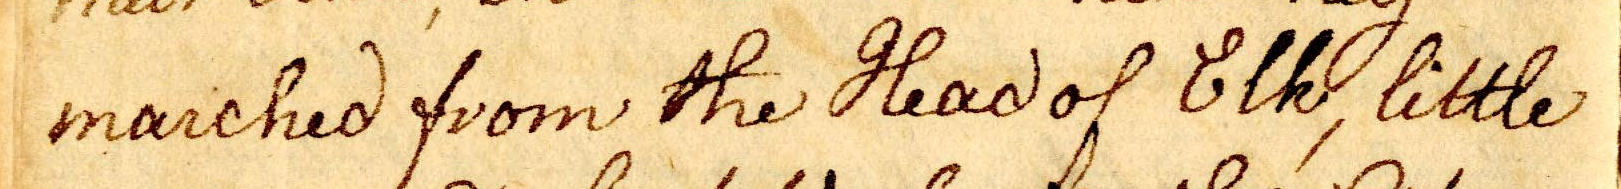marched from the Head of Elk little
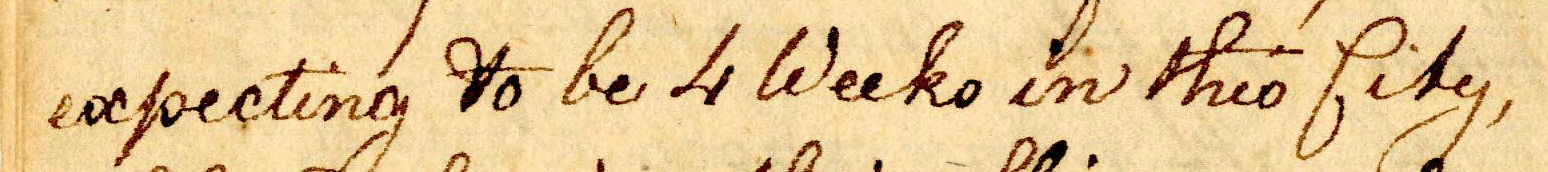expecting to be 4 Weeks in this City,
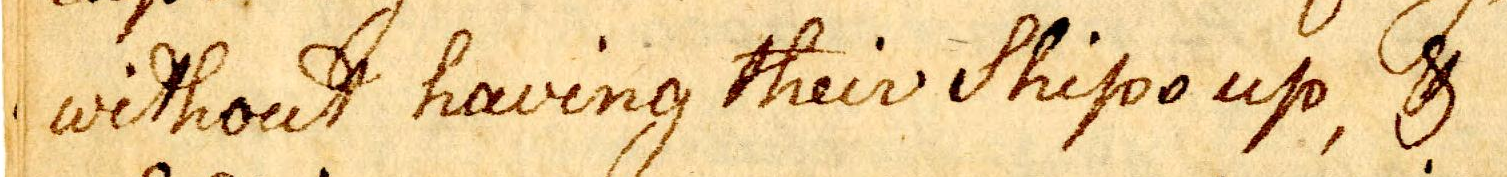without having their Ships up &
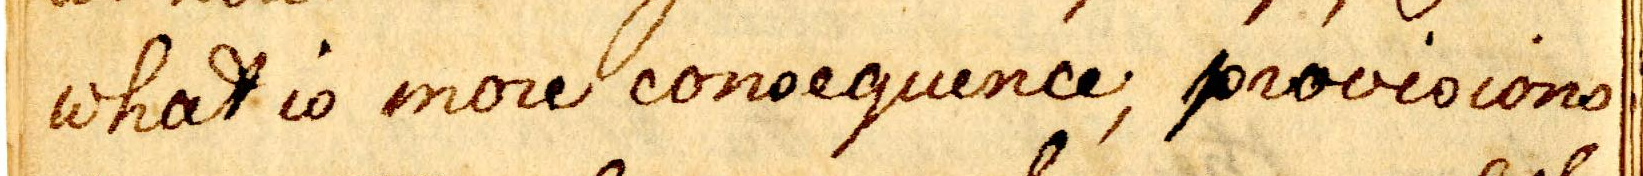what is more consequence, provisions
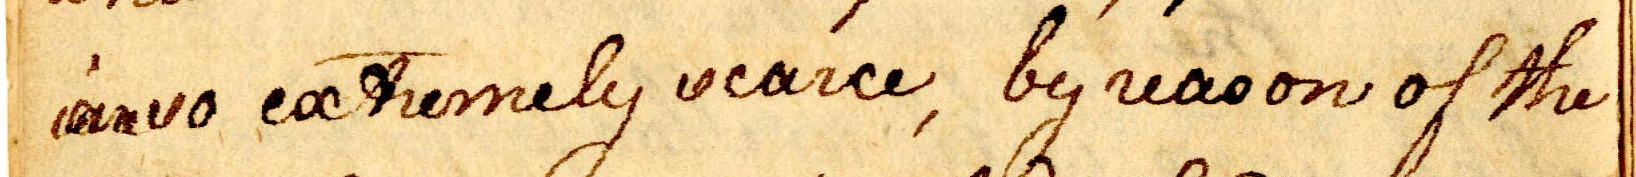in so extremely scarce, by reason of the
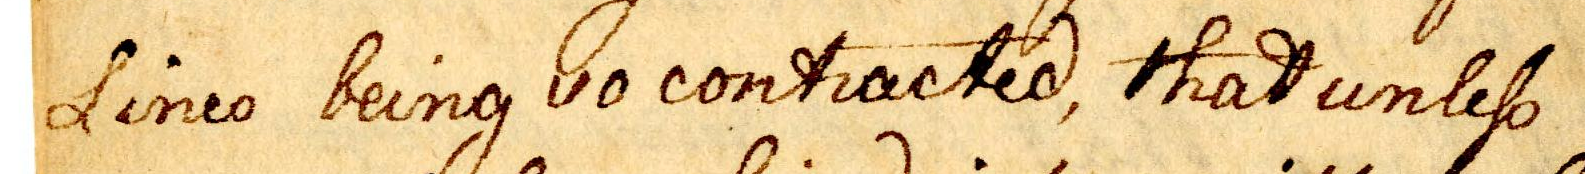Lines being so contracted, that unless
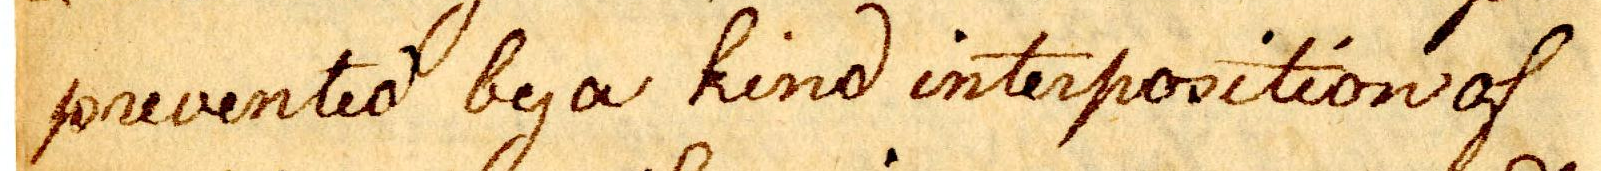prevented by a kind interposition of
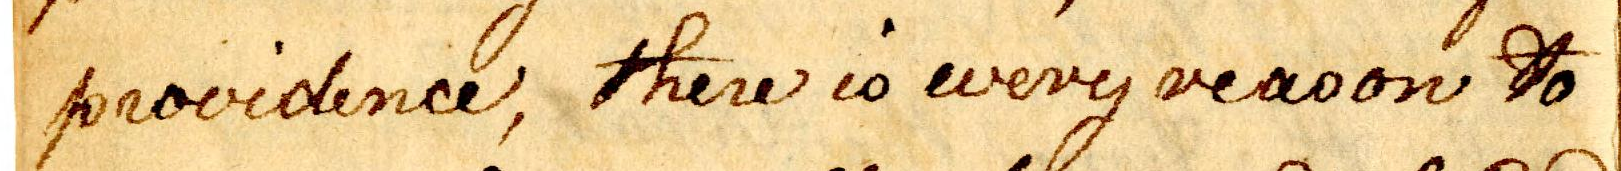providence, there is every reason to
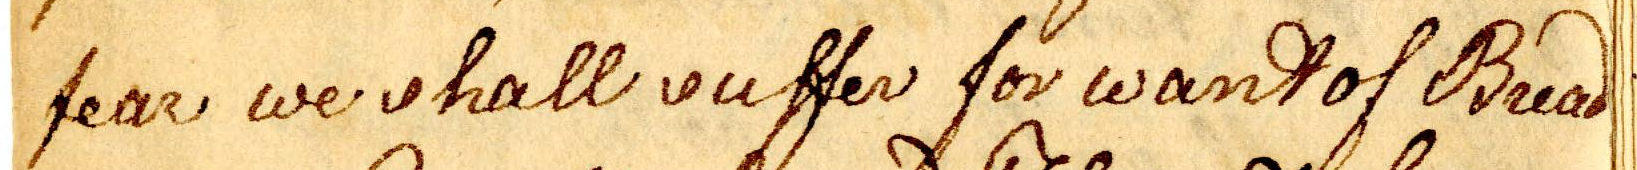fear we shall suffer for want of Bread
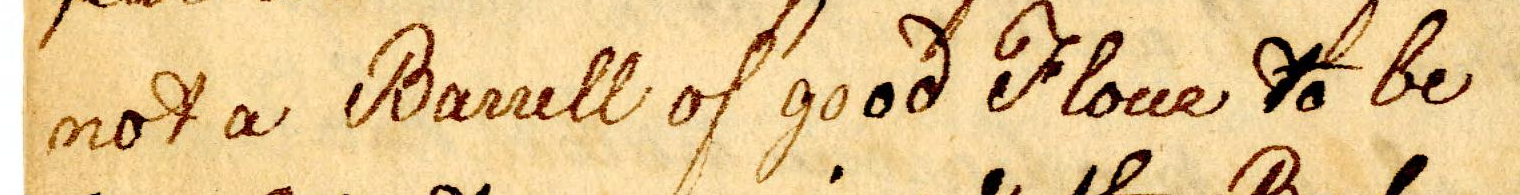not a Barrell of good Flour to be
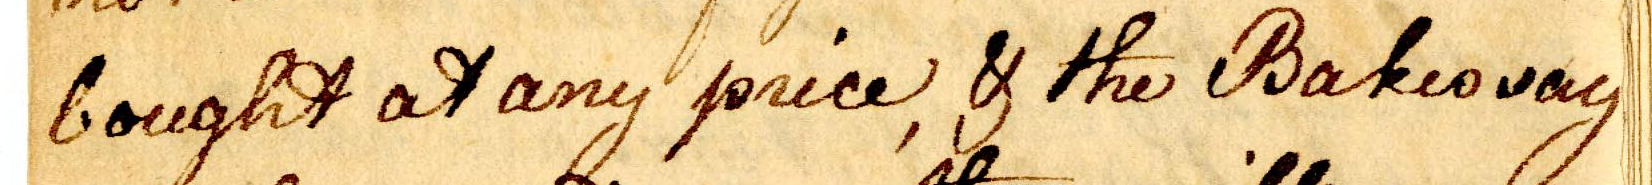bought at any price & the Bakes say
